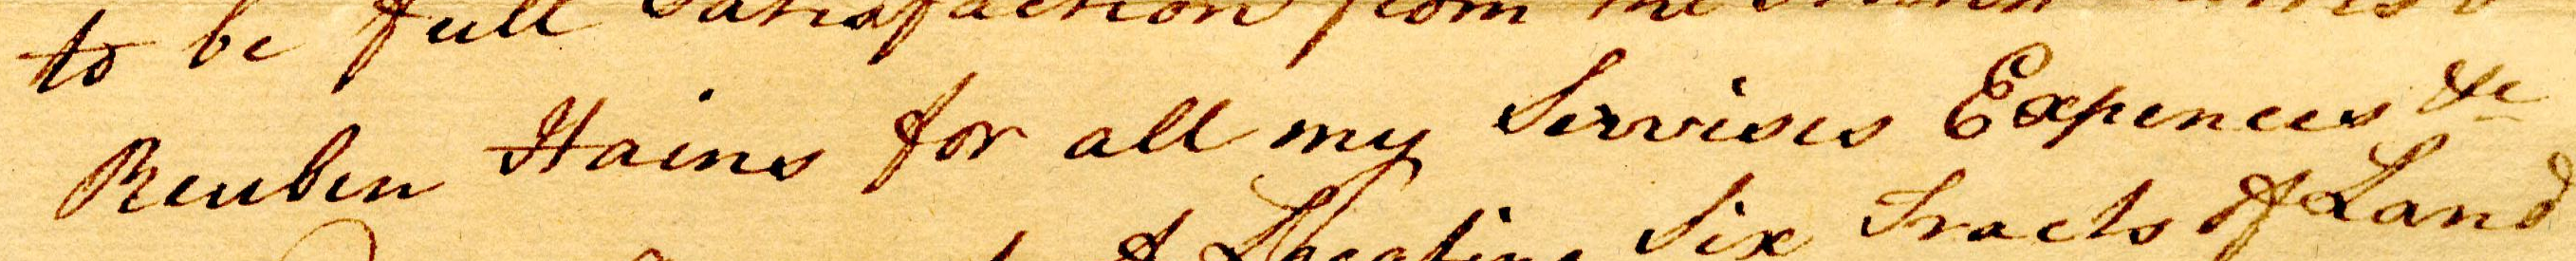Reuben hains for all my services Expences &c
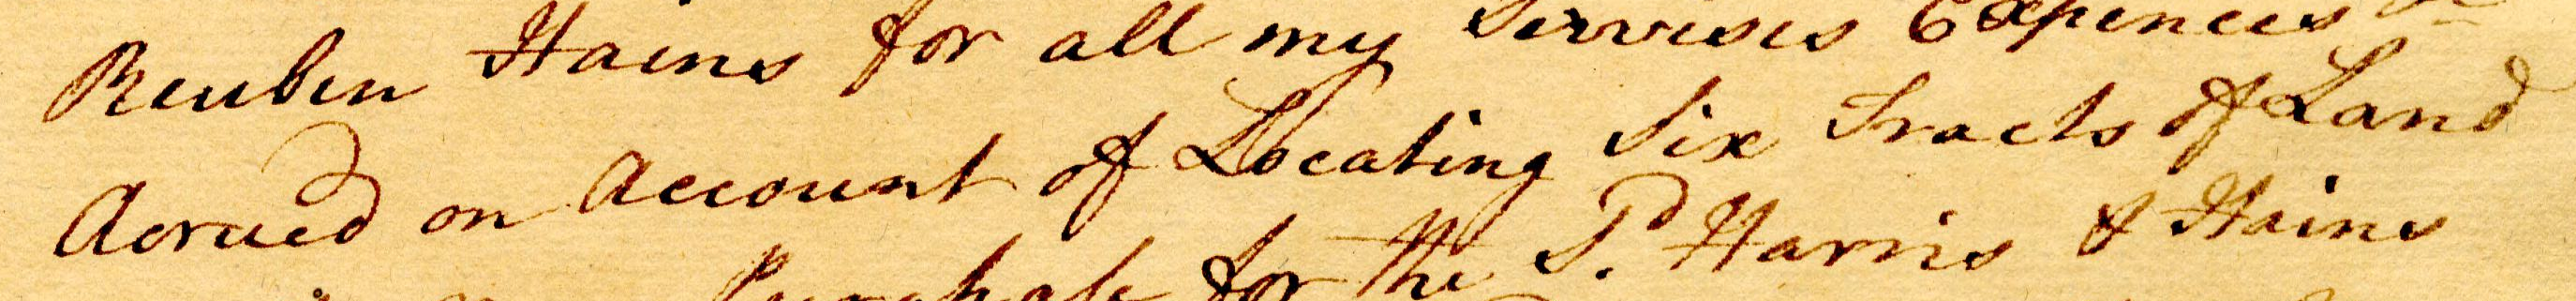Accrued on account of Locating Six Tracts of Land
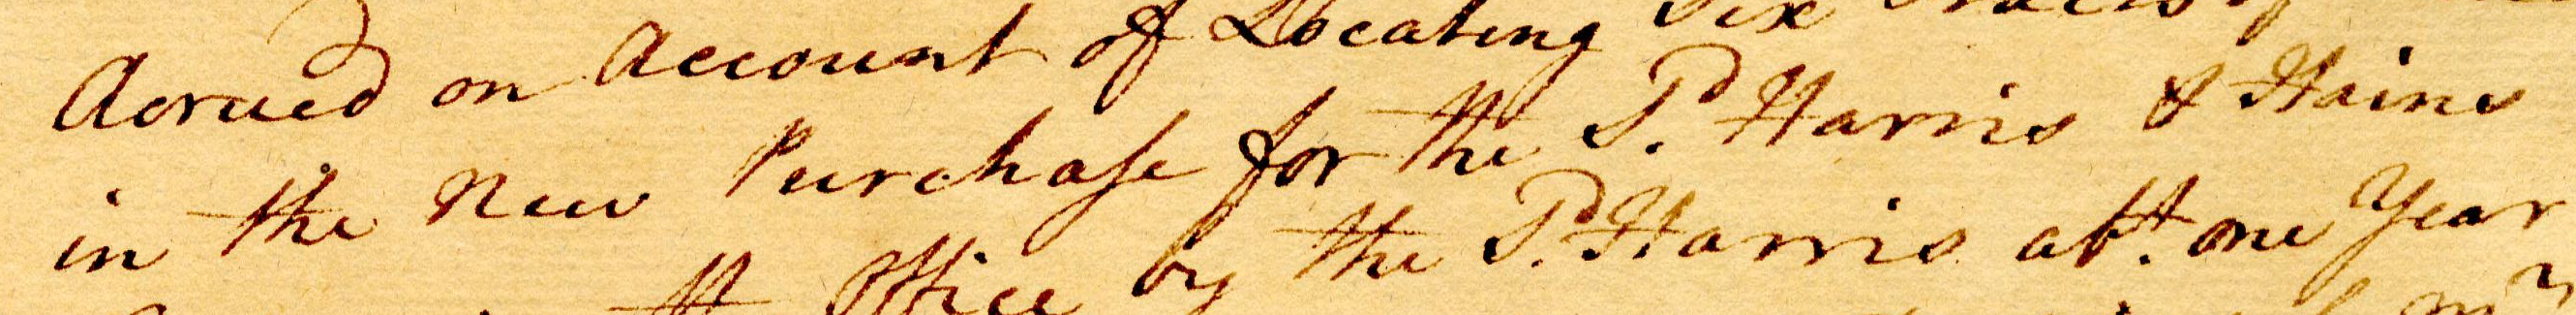in the new Purchase for the s^d. Harris & Hains
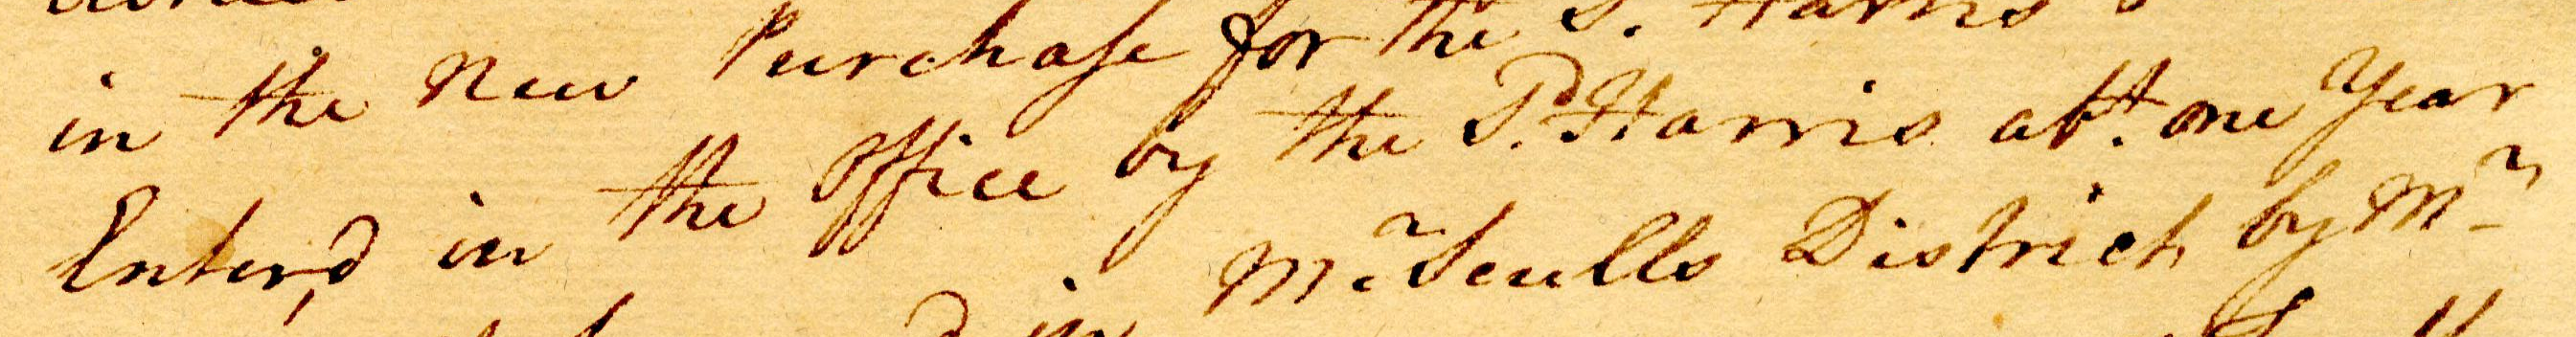Enter'd in the office by the s^d. Harris ab^t. one year
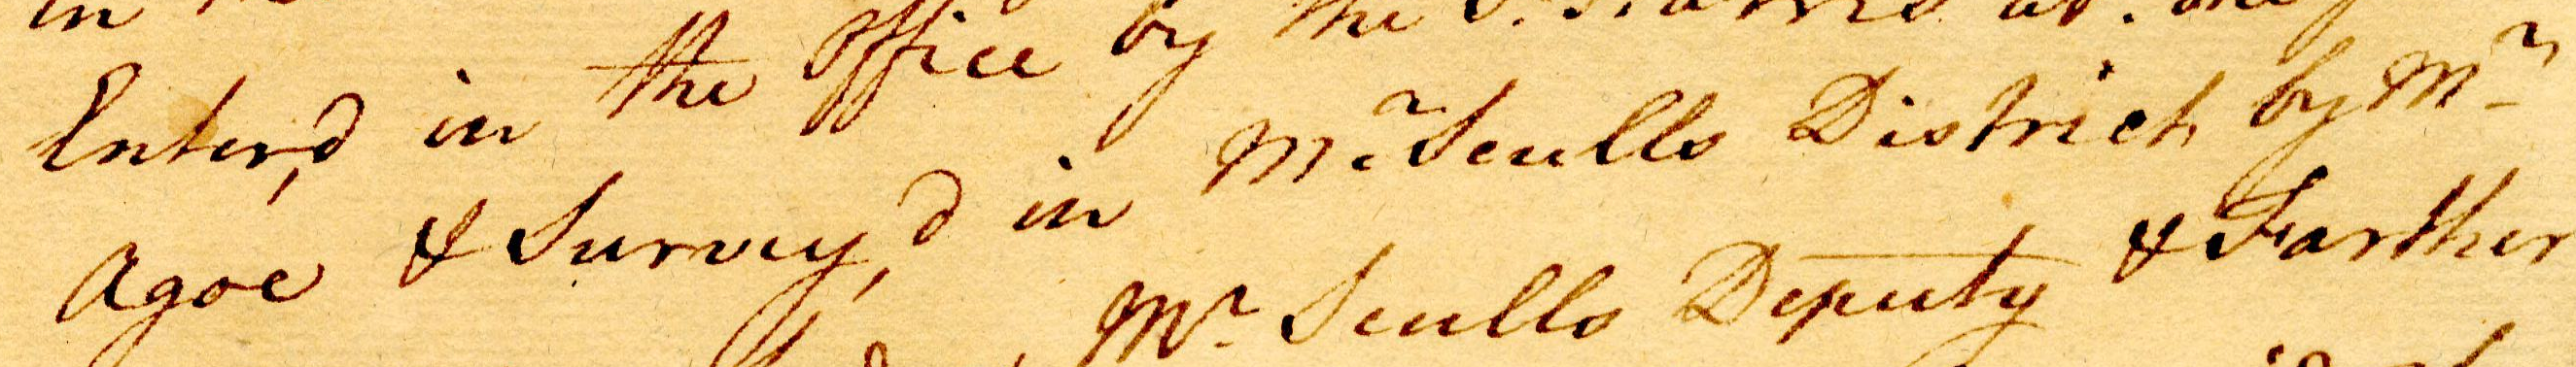agoe & survey'd in M^r. Sculls District by M^r.
